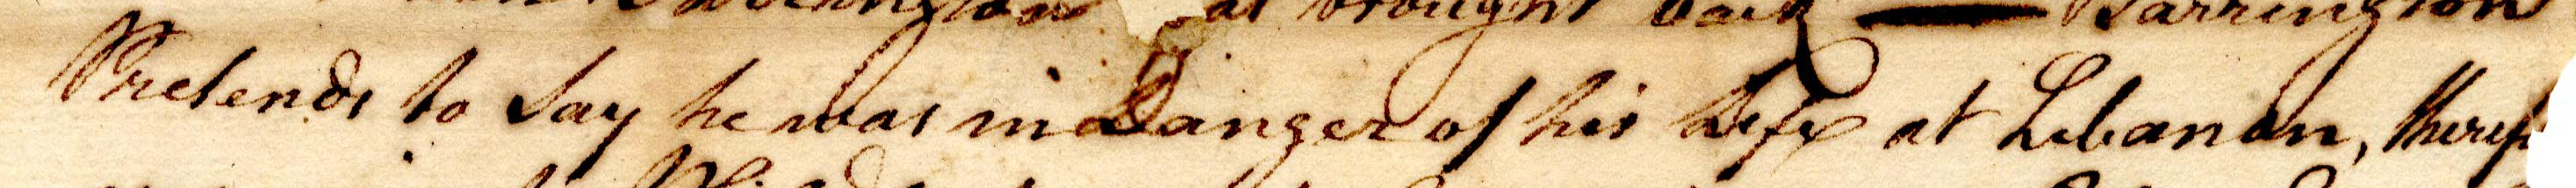Pretends to say he was in Danger of his Life at Lebanaon, therefore
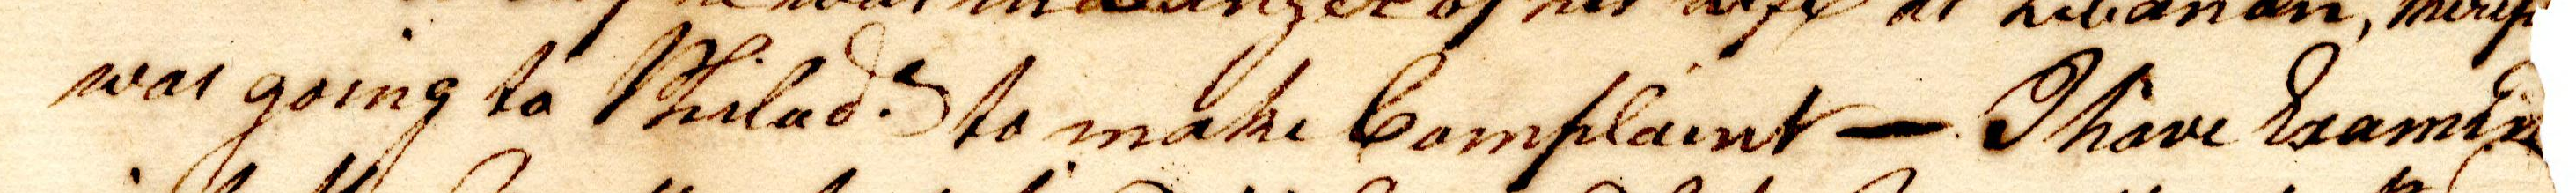was going to Philad^a. to make Complaint. I have Examined
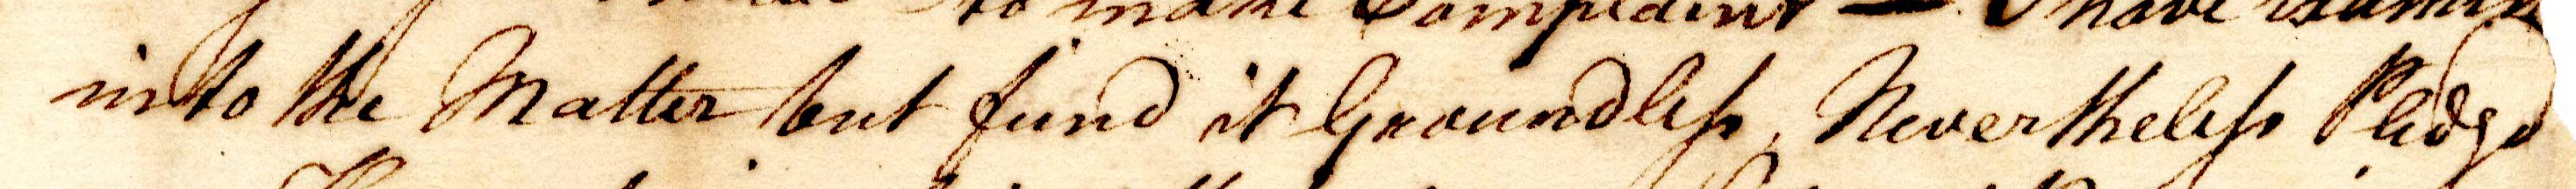into the Matter but find it Groundless, Nevertheless Pledge
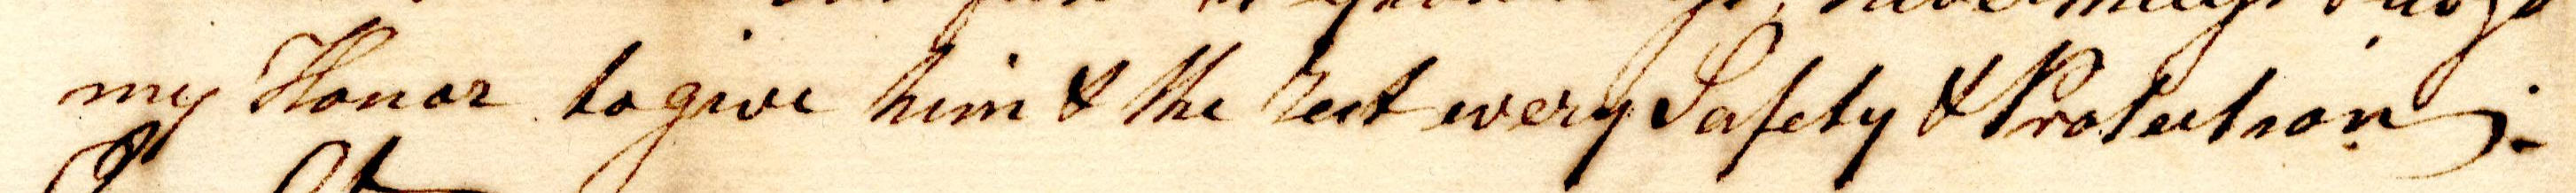my Honor to give him & the rest every Safety & Protection.
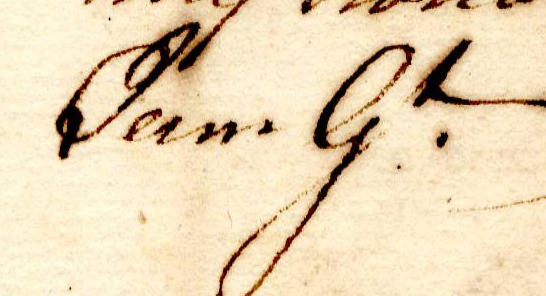I am G^l.
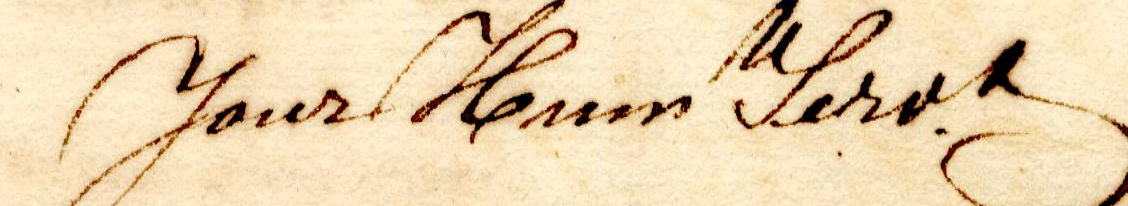Your Hum^le Serv^t
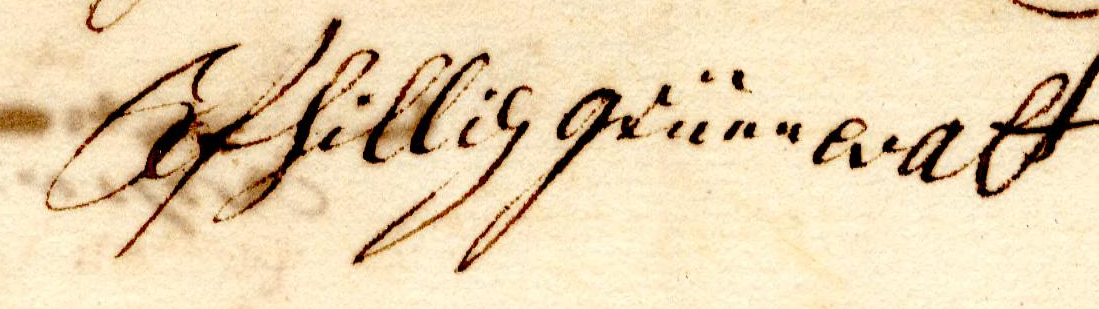Afhillig grünewalt
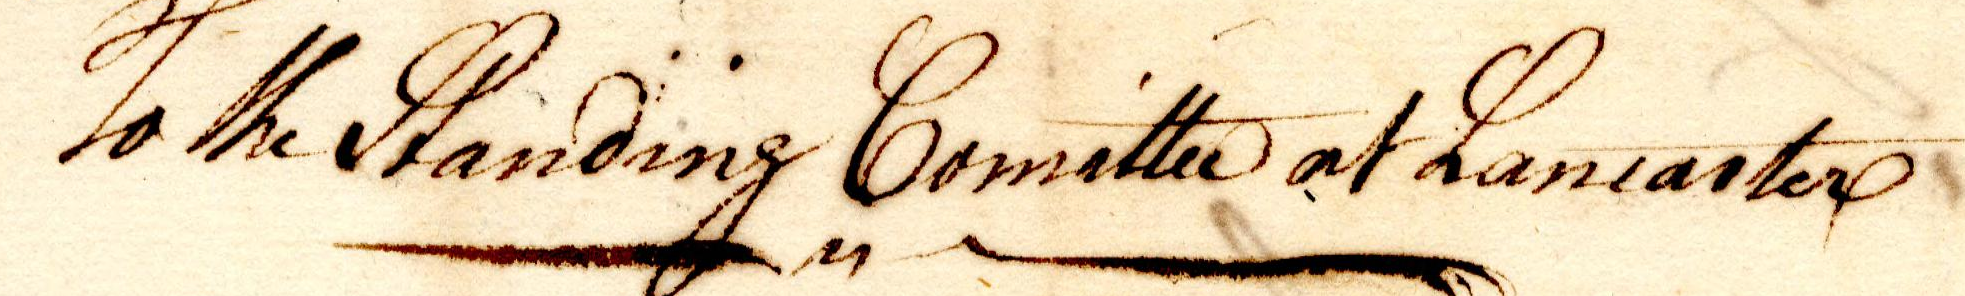To the Standing Comittee at Lancaster
